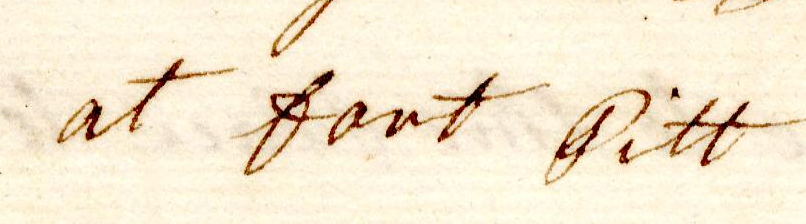at fort Pitt
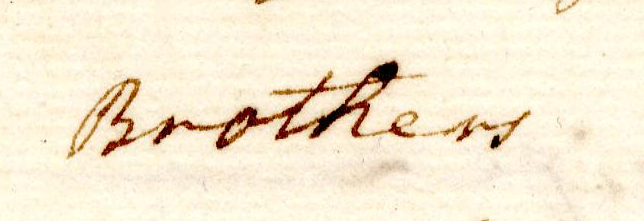Brothers
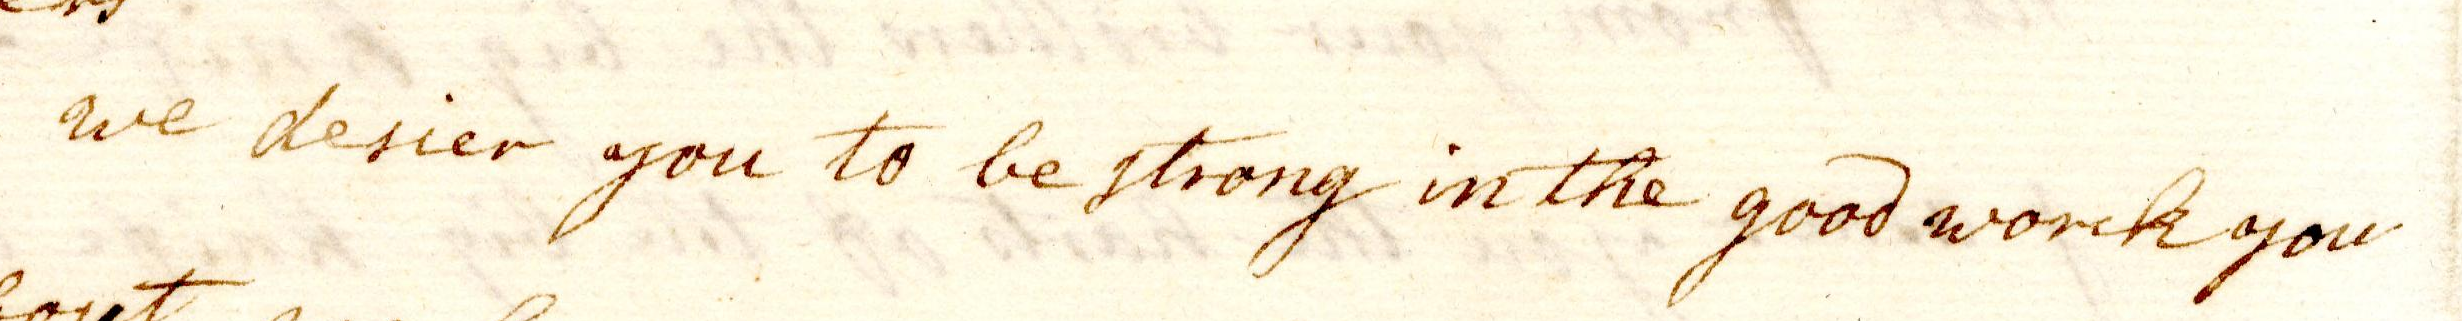we desier you to be strong in the good worck you
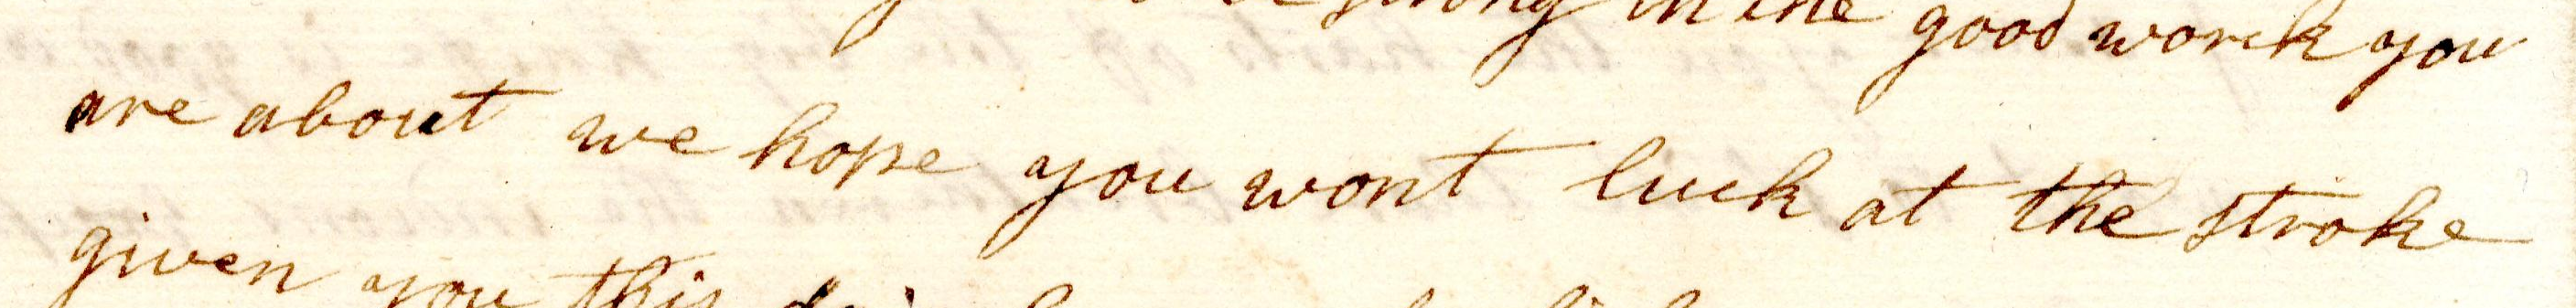are about we hope you wont luck at the stroke
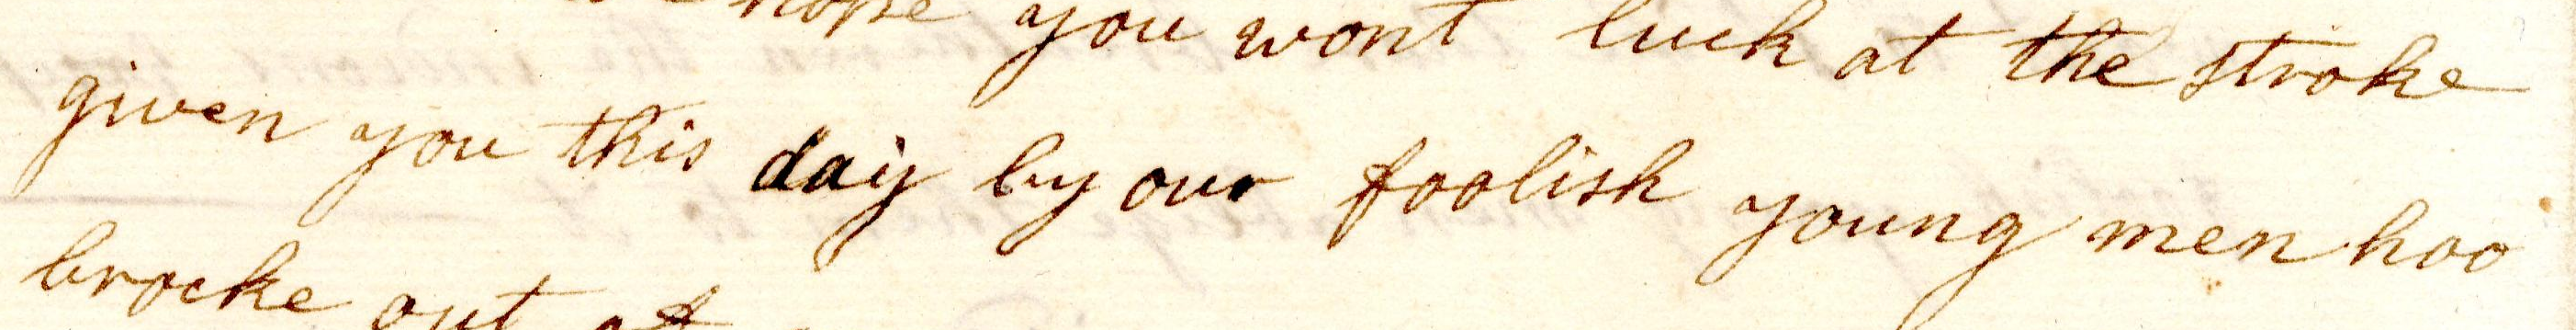given you this day by our foolish young men hoo
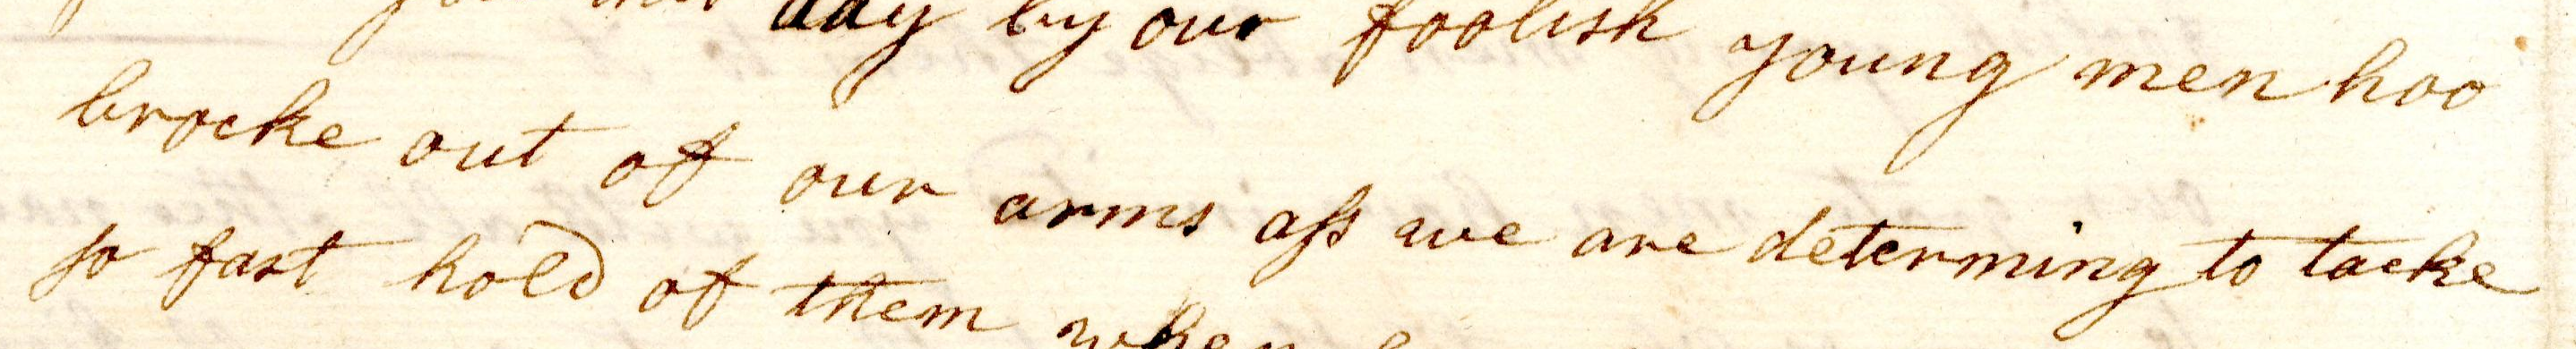brocke out of our arms ass we are determing to tacke
